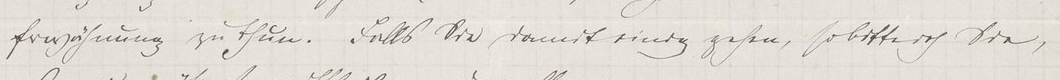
Erwähnung zu thun. Falls Sie damit einig gehen, so bitte ich Sie,
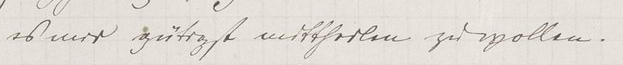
es mir gütigst mittheilen zu wollen.
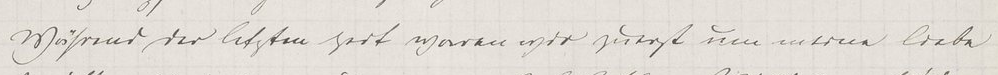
Während der letzten Zeit waren wir zuerst um meine liebe
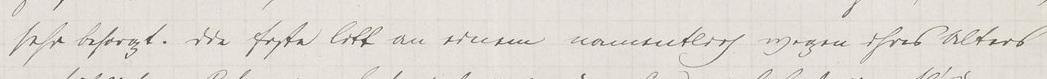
sehr besorgt. Die Erste litt an einem namentlich wegen ihres Alters
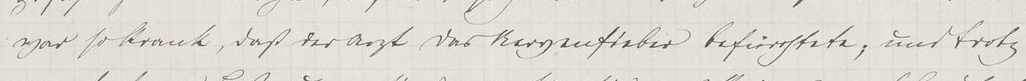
war so krank, daß der Arzt das Nervenfieber befürchtete; und trotz
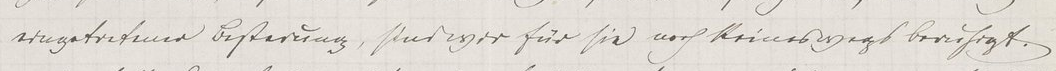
eingetretener Beßerung, sind wir für sie noch keineswegs beruhigt.
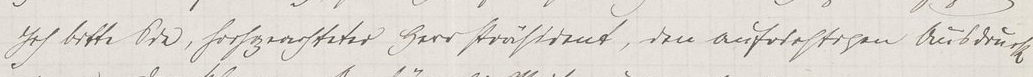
Ich bitte Sie, hochgeachteter Herr Präsident, den aufrichtigen Ausdruck
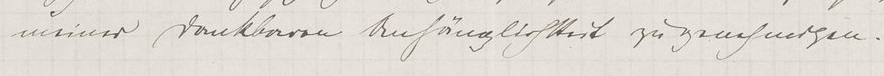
meiner dankbaren Anhänglichkeit zu genehmigen.
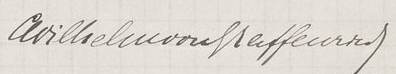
Wilhelm von Graffenried
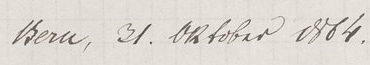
Bern, 31. Oktober, 1864.
